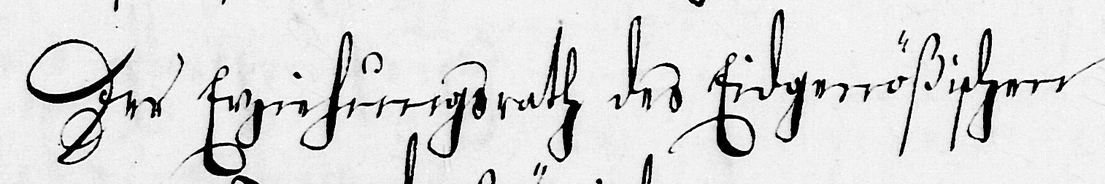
Der Erziehungsrath des Eidgenößischen
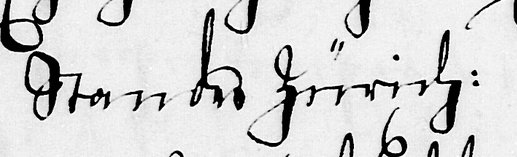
Standes Zürich:
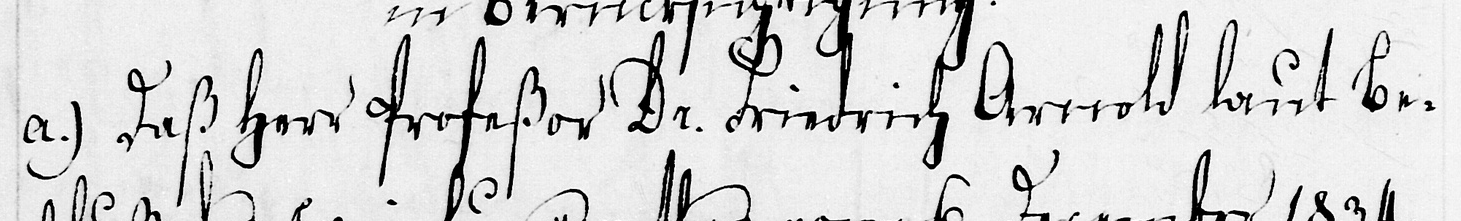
a.) Daß Herr Profeßor Dr. Friedrich Arnold laut Be¬
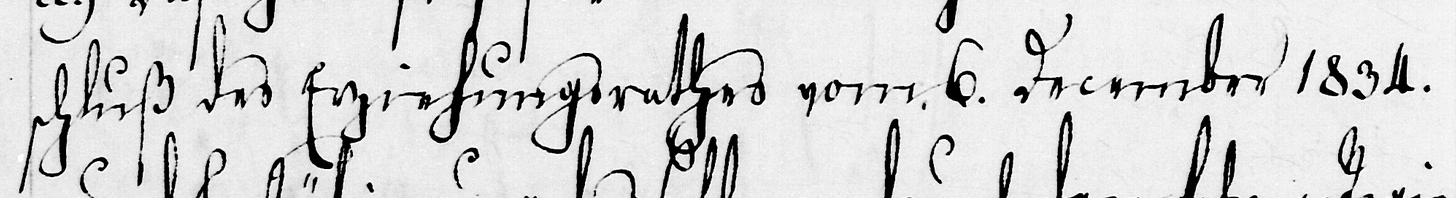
schluß des Erziehungsrathes vom 6. December 1834.
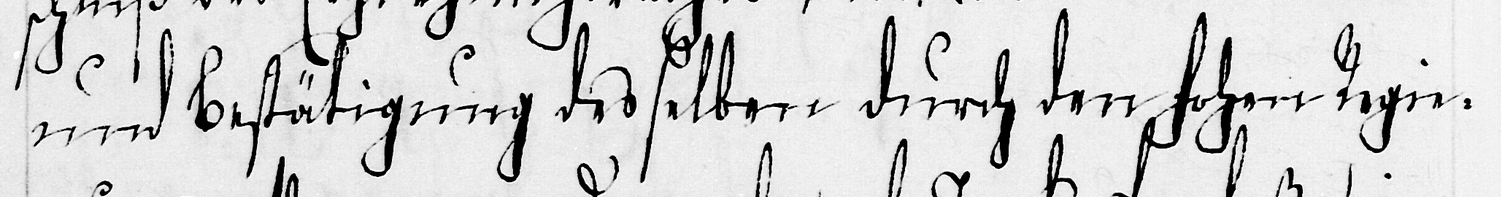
und Bestätigung desselben durch den Hohen Regie¬
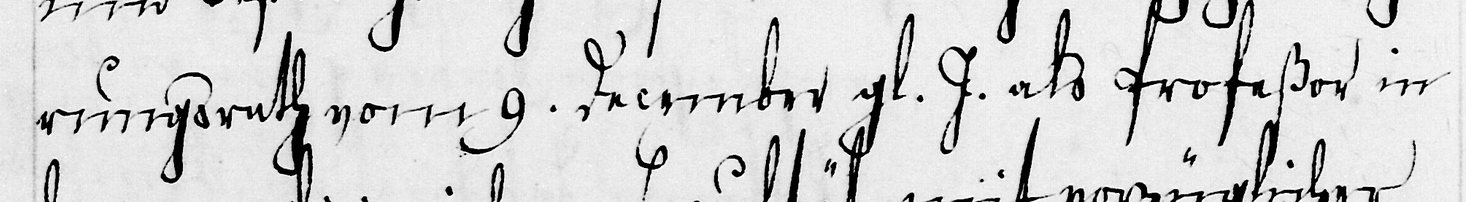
rungsrath vom 9. December gl. J. als Profeßor in
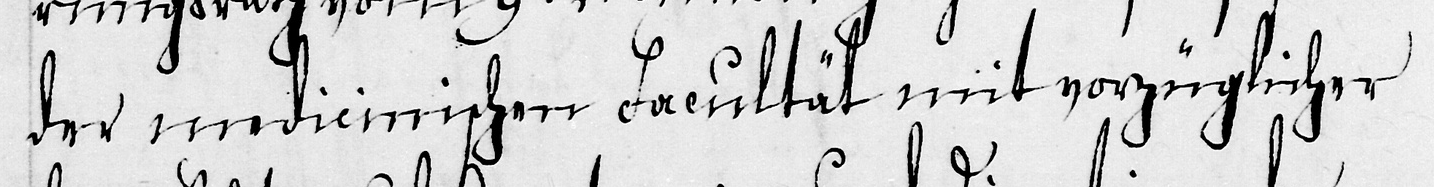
der medicinischen Facultät mit vorzüglicher
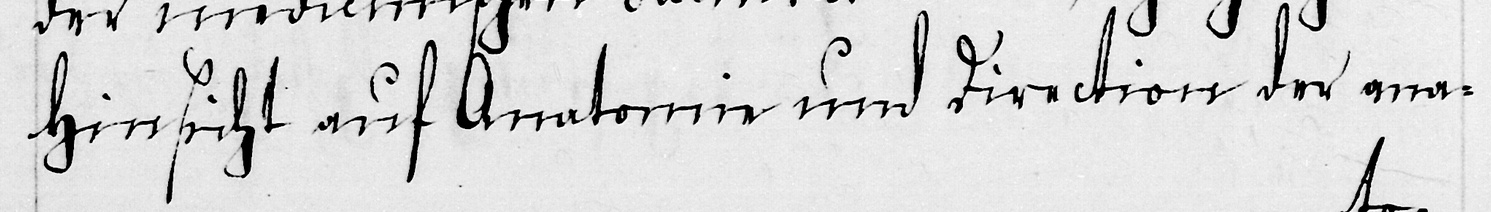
Hinsicht auf Anatomie und Direction der ana-
